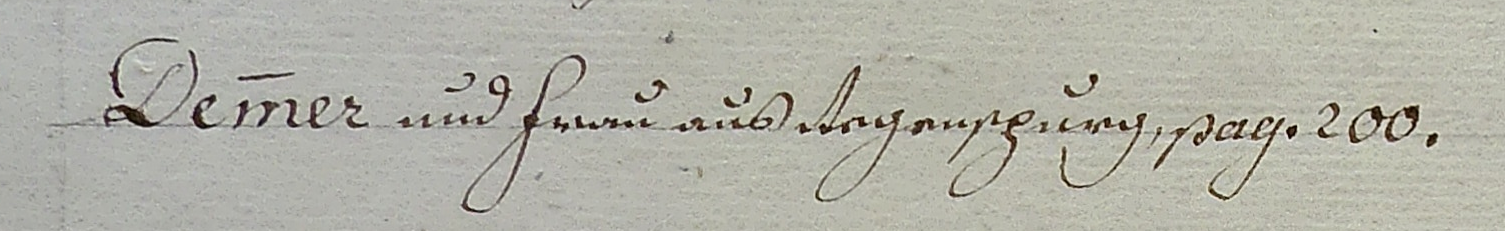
Dem̅er und Frau aus Regenspurg, pag. 200.
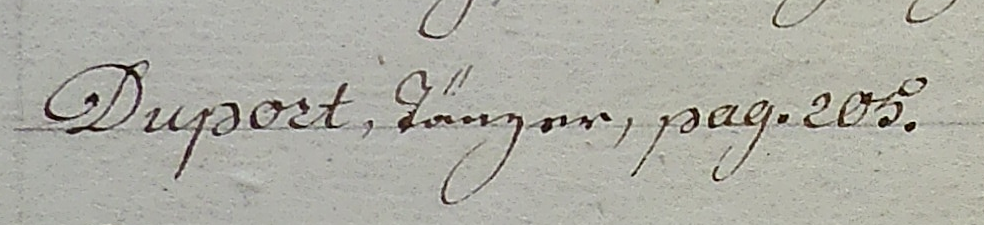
Duport, Tänzer, pag. 205.
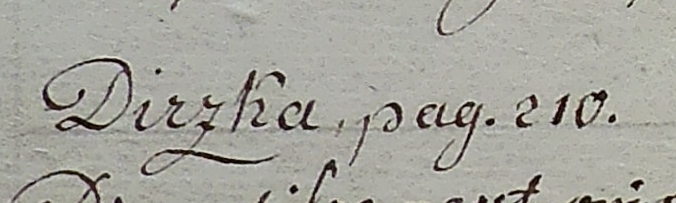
Dirzka, pag. 210.
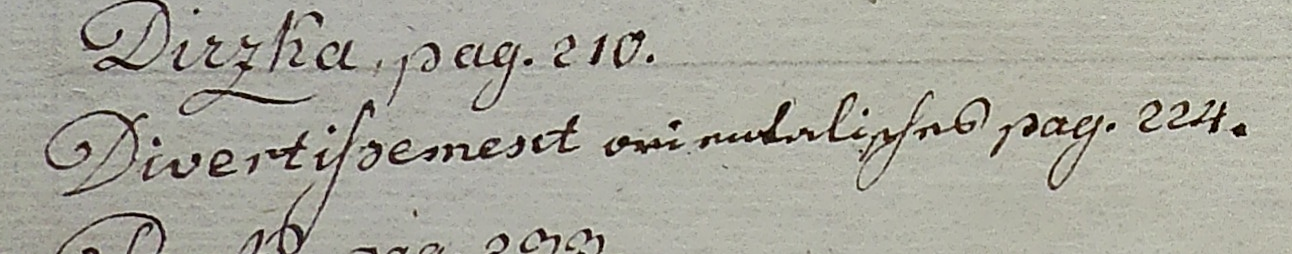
Divertissement orientalisches pag. 224.
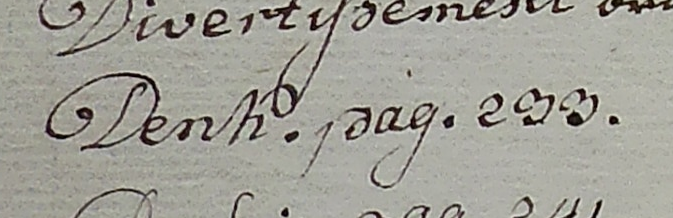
Denk, pag. 233.
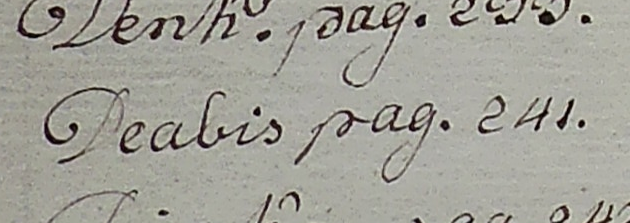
Deabis pag. 241.
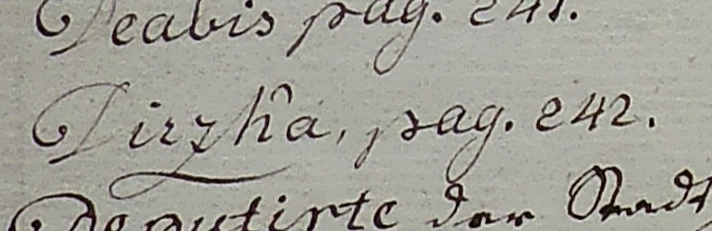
Dirzka, pag. 242.
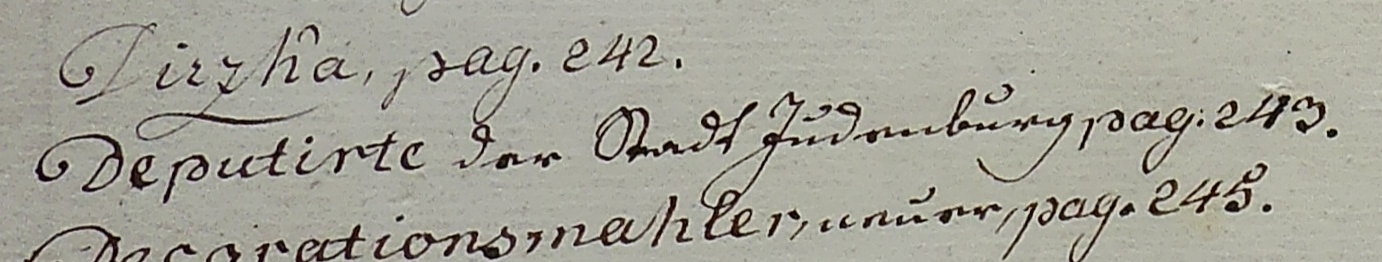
Deputirte der Sadt Jundenburg pag. 243.
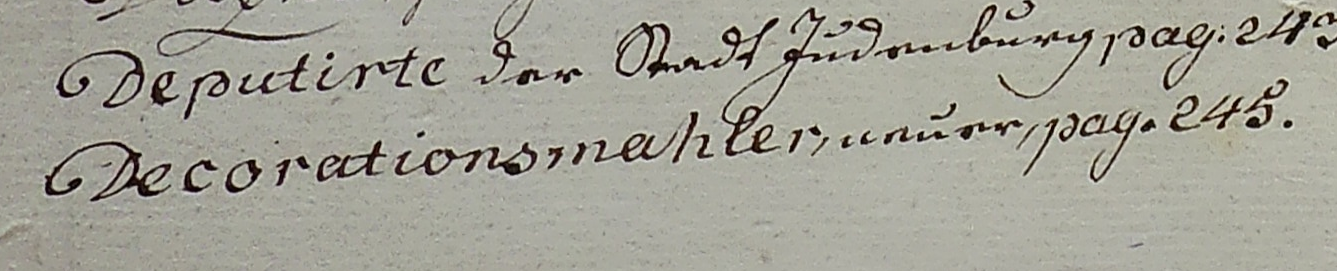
Decorationsmahler, neuer, pag. 245.
